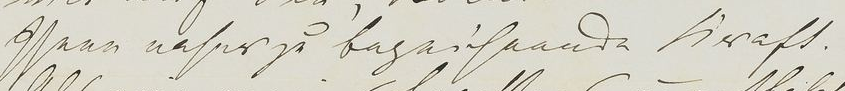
Ihnen näher zu bezeichnende Kraft. –
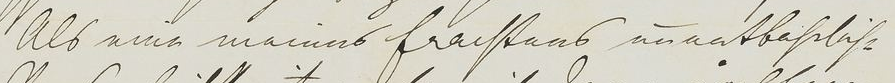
Als eine meines Erachtens unentbehrliche
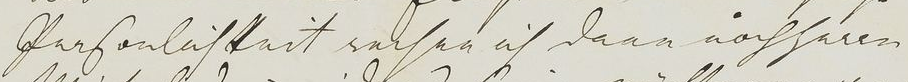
Persönlichkeit rechne ich dann noch Herrn
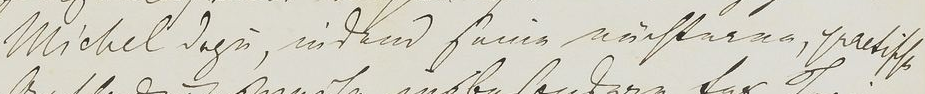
Michel dazu, indem seine nüchterne, practische
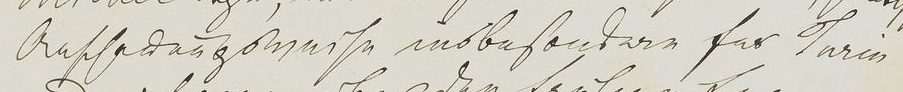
Anschauungsweise insbesondere für Turin
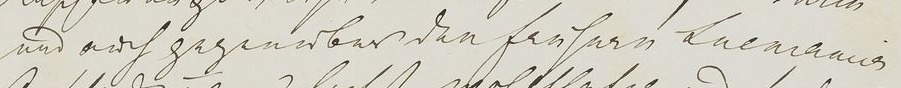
und auch gegenüber den frühern Lucmanier
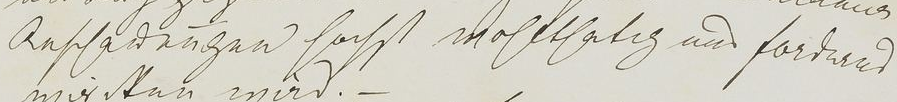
Anschauungen höchst wohlthätig und fördernd
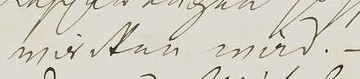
wircken wird. –
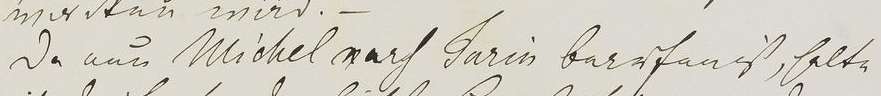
Da nun Michel nach Turin berufen ist, halte
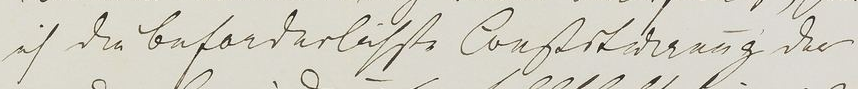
ich die beförderlichste Constituirung der
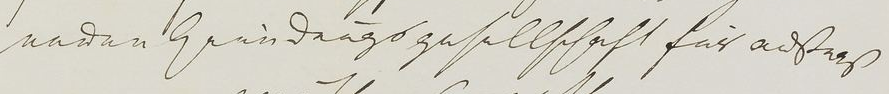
neuen Gründungsgesellschaft für äußerst
